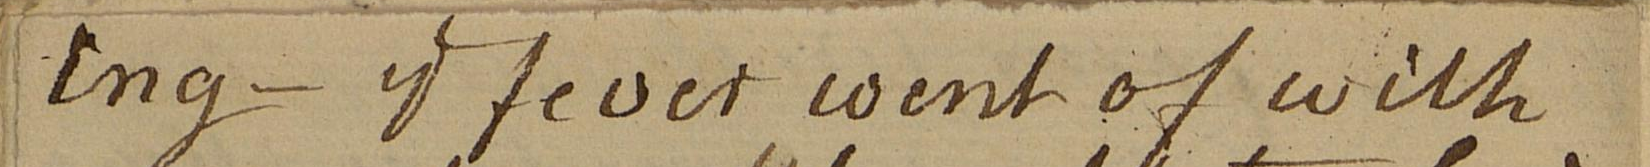ing- y^e fever went of with
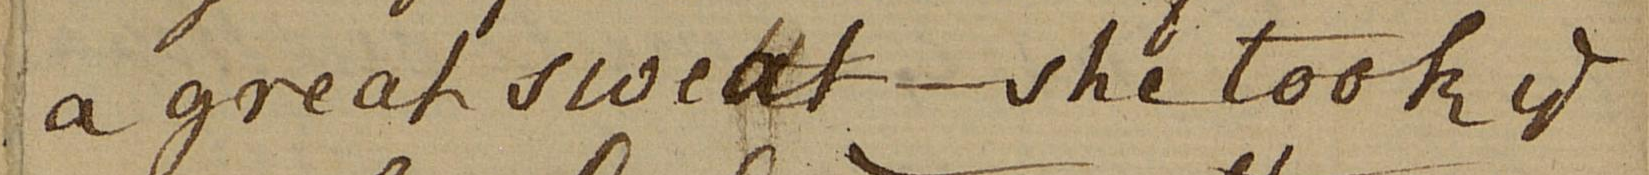a great sweat- she took y^e
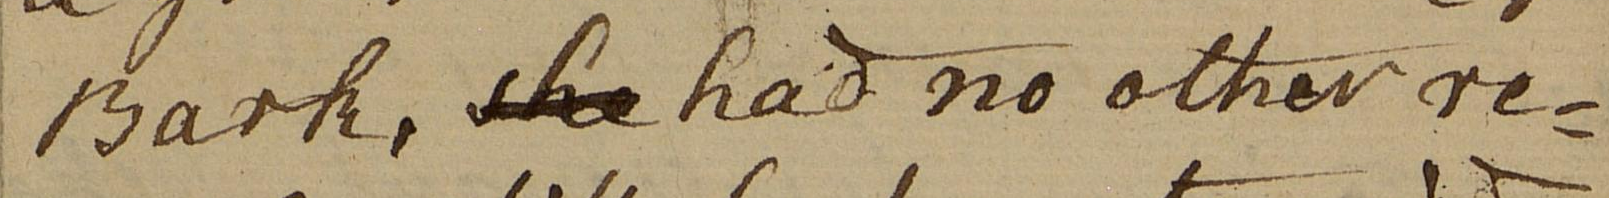Bark, she had no other re-
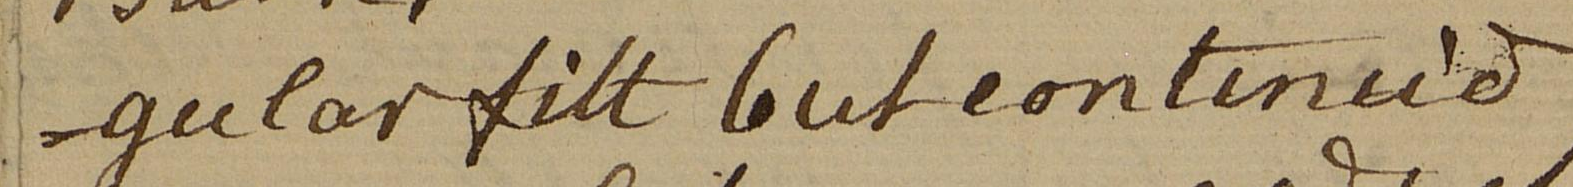-gular fitt but continu'd
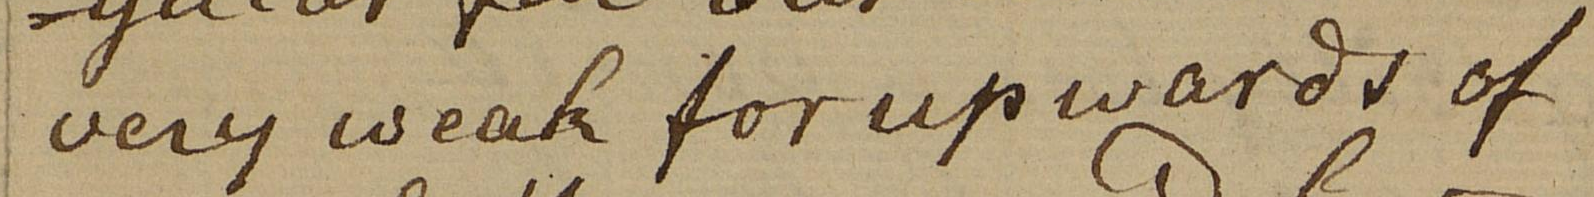very weak for upwards of
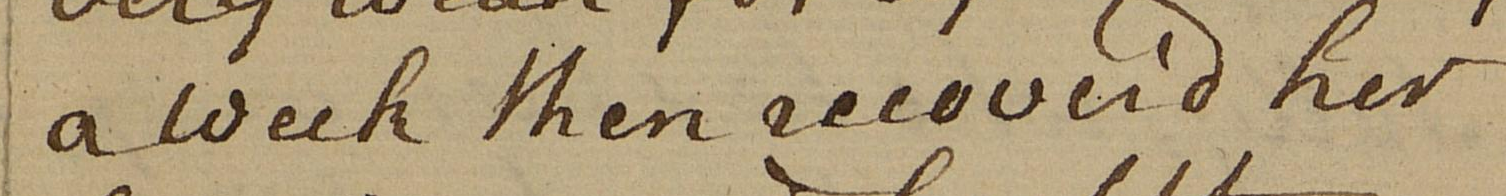a week then recover'd her
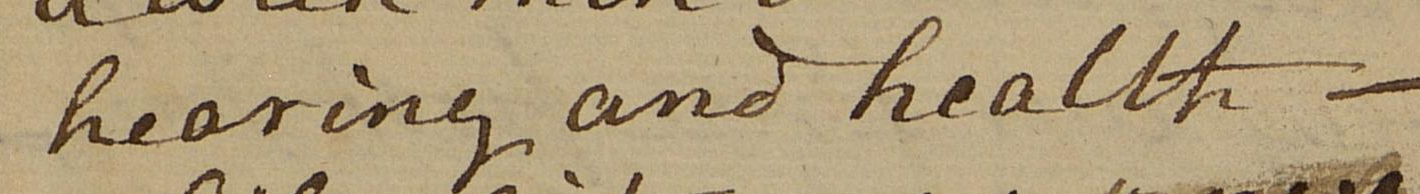hearing, and health-
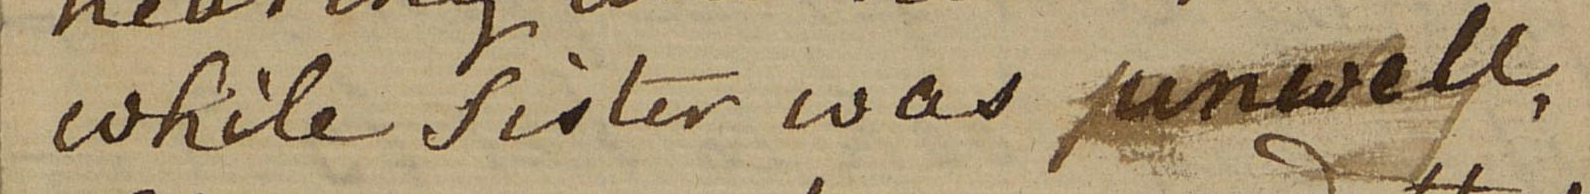while Sister was unwell,
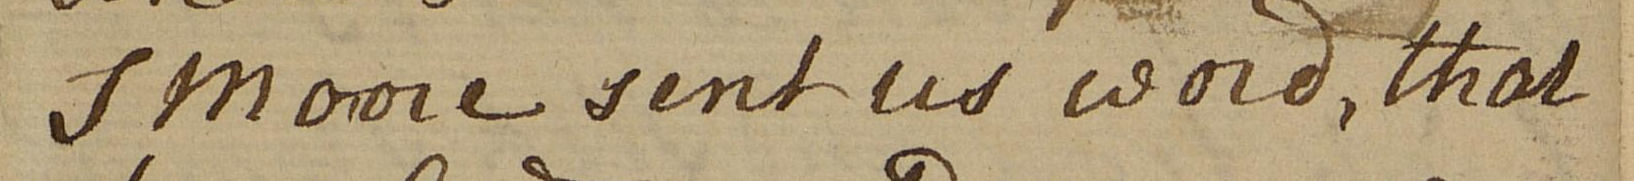S Moore sent us word, that
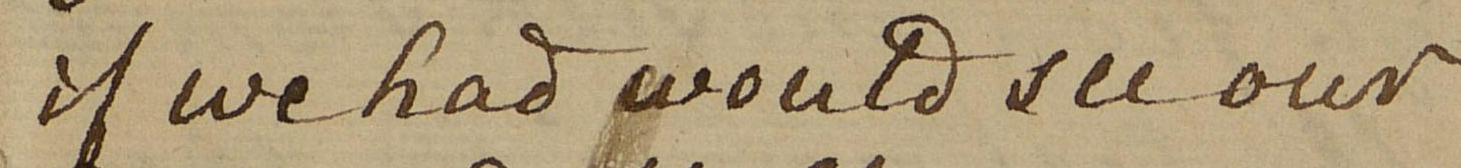if we had would see our
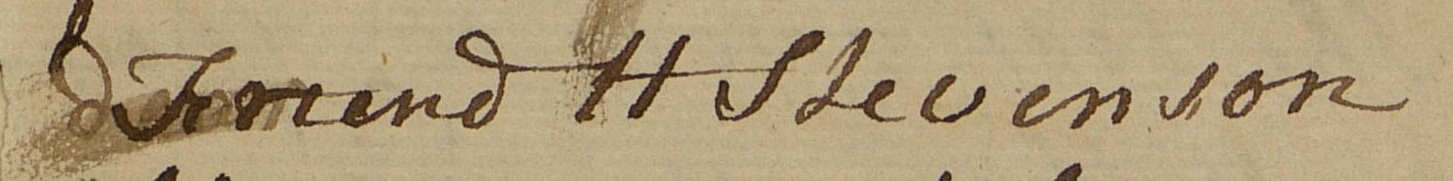Friend H Stevenson
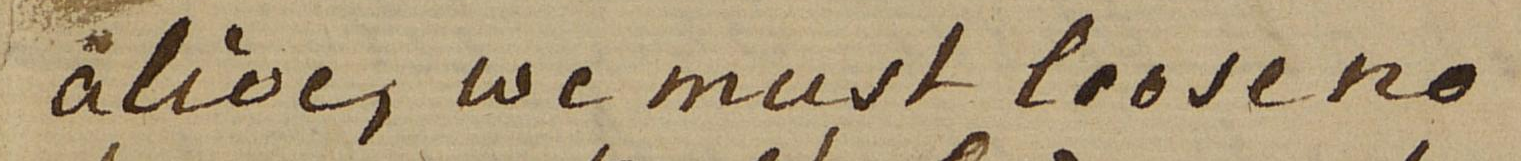alive, we must loose no
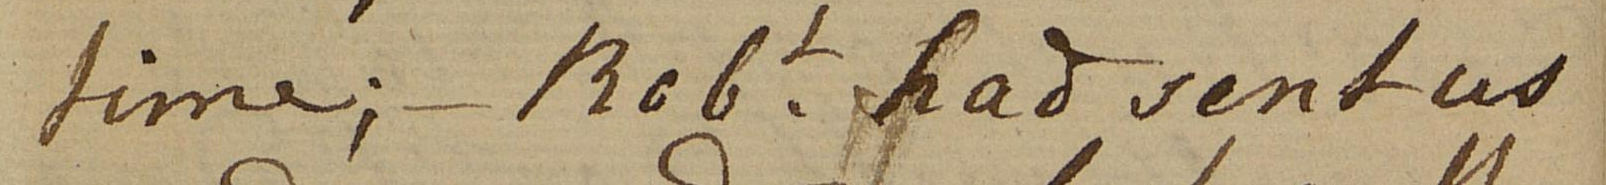time;- Rob^t. had sent us
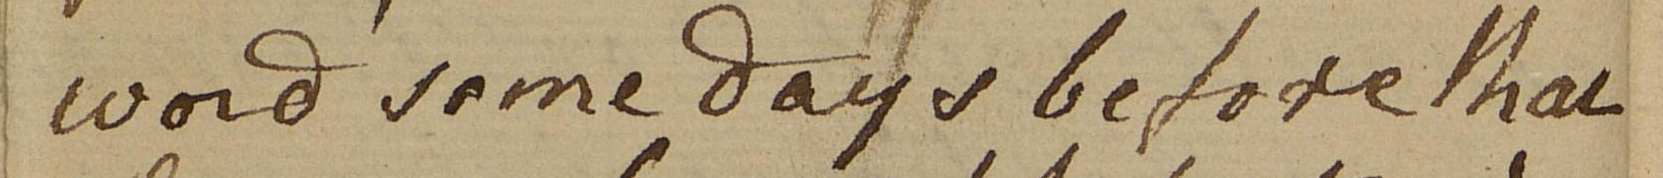word some days before that
